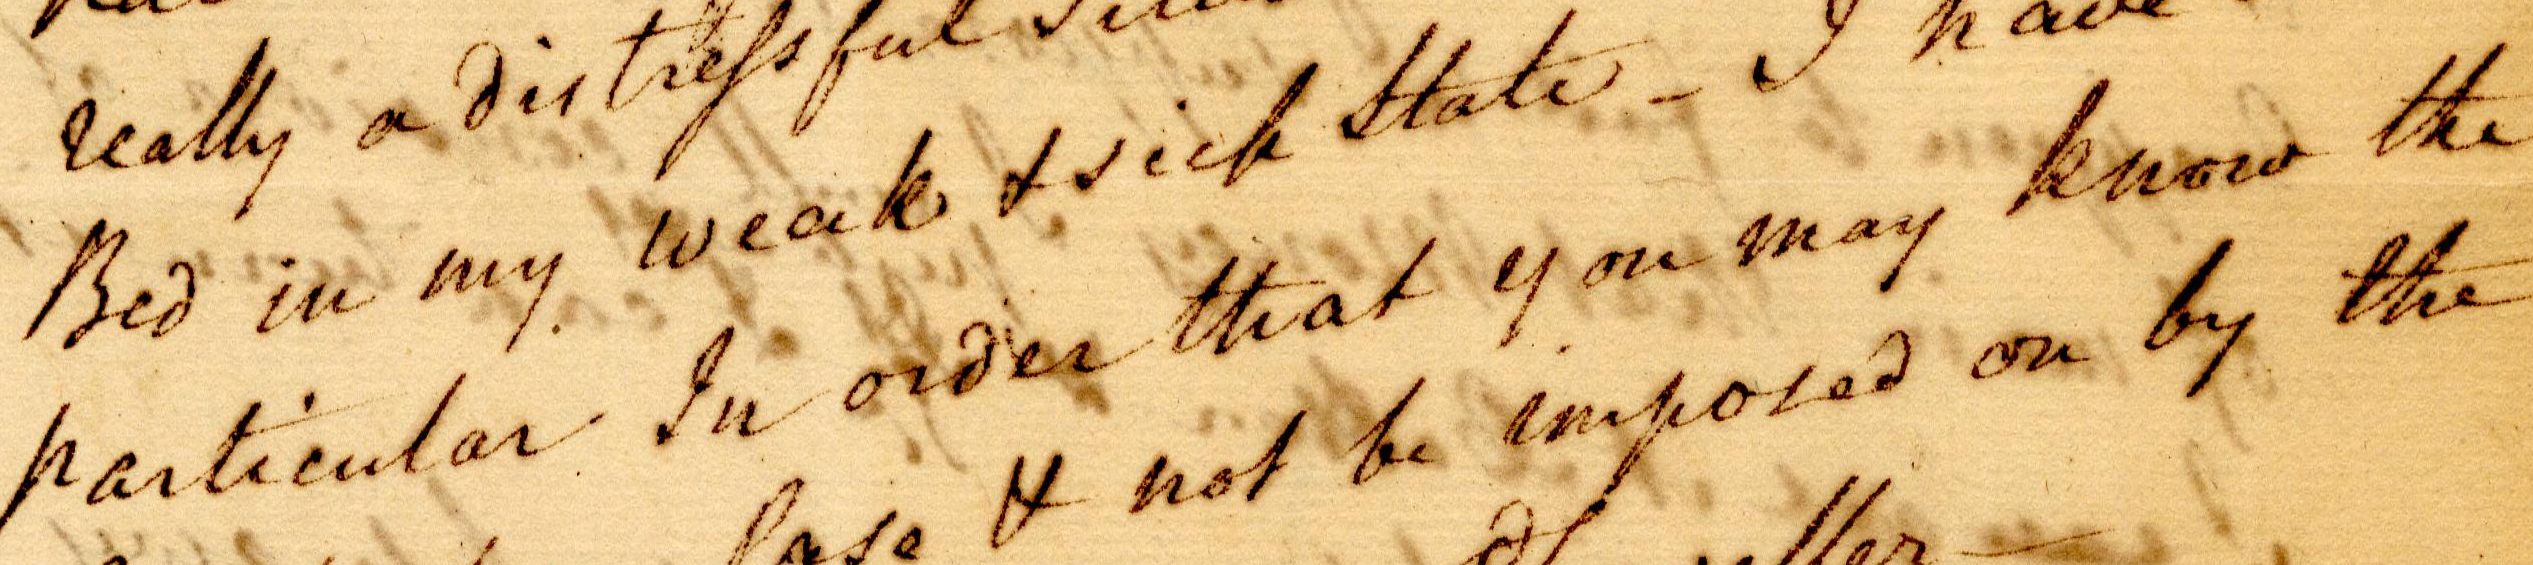particular In order that you may know the
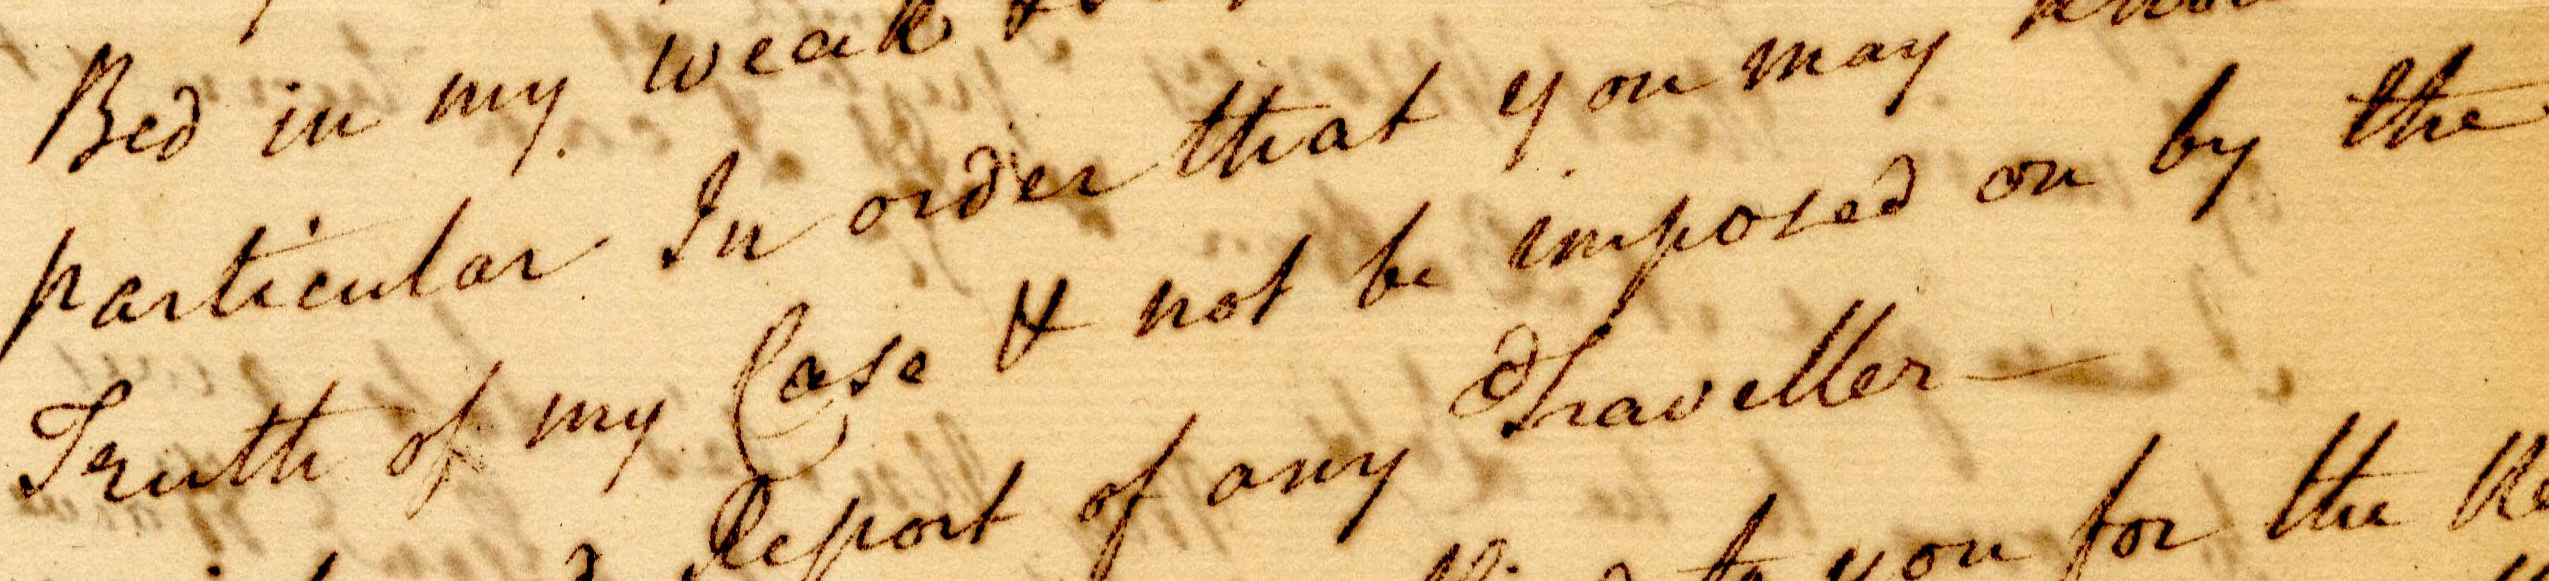Truth of my Case & not be imposed on by the
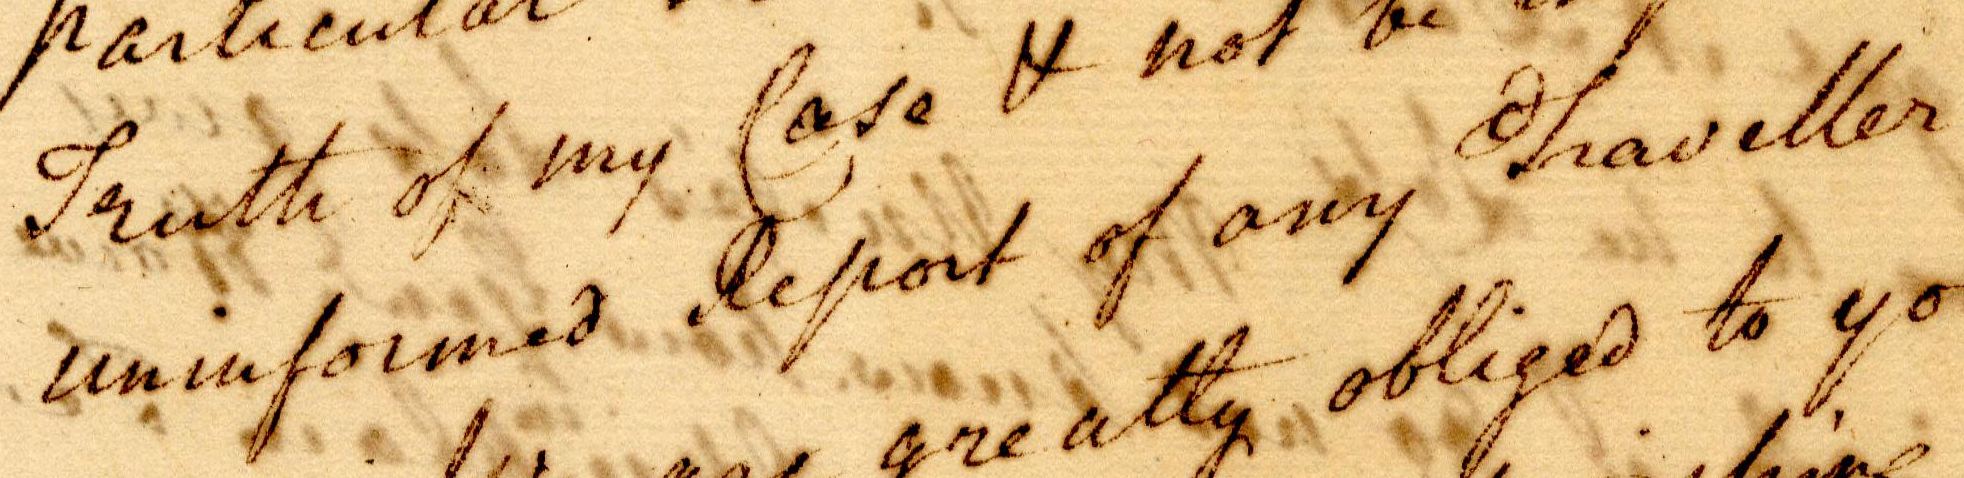uninformed Report of any Traveller
